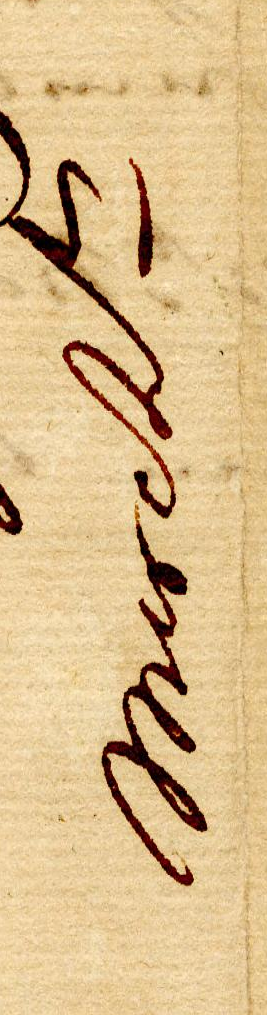Merch^t
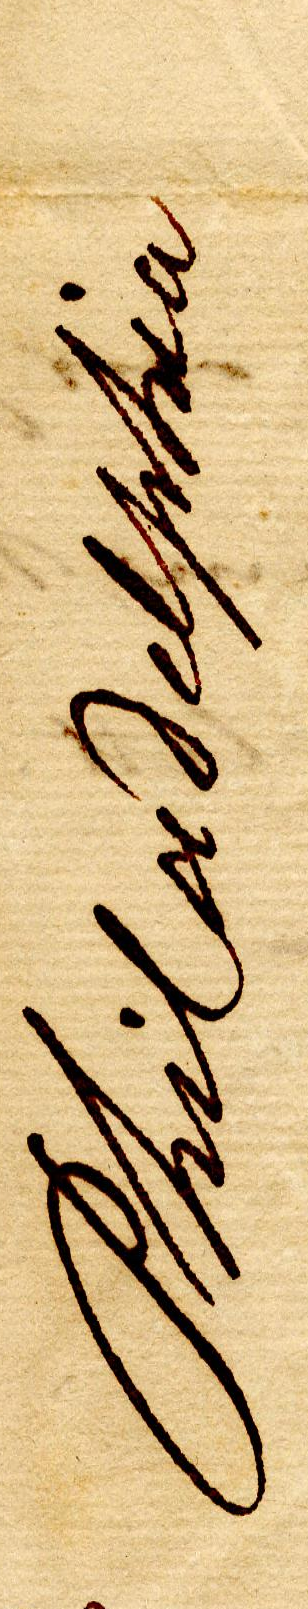Philadelphia
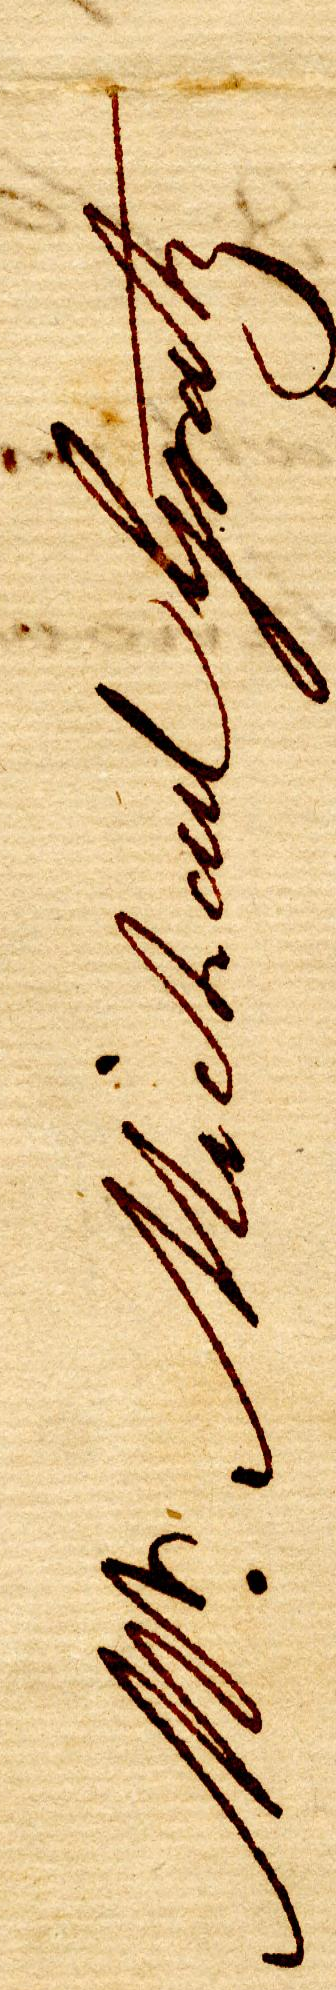M^r Michael Gratz
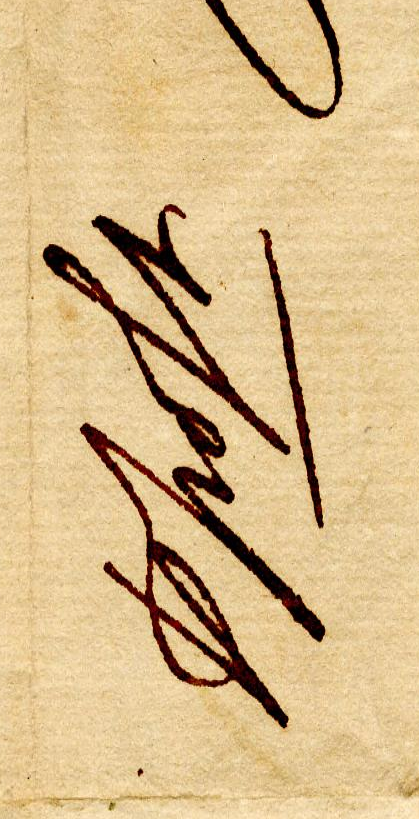to post
